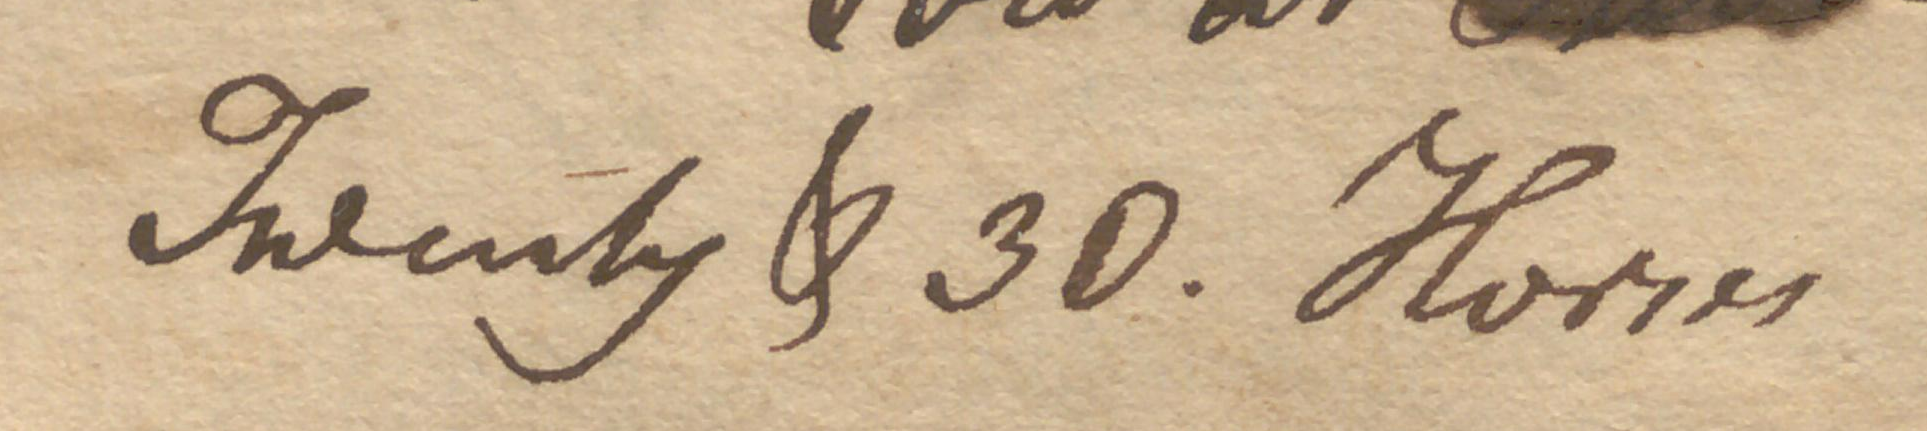Twenty & 30. Horses
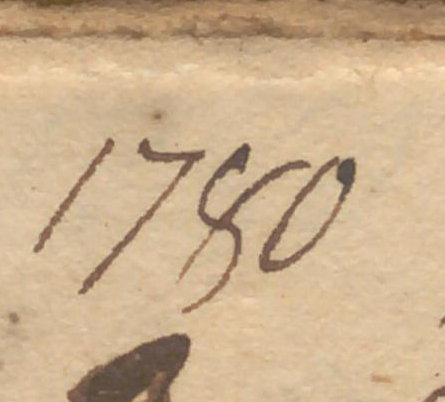1780
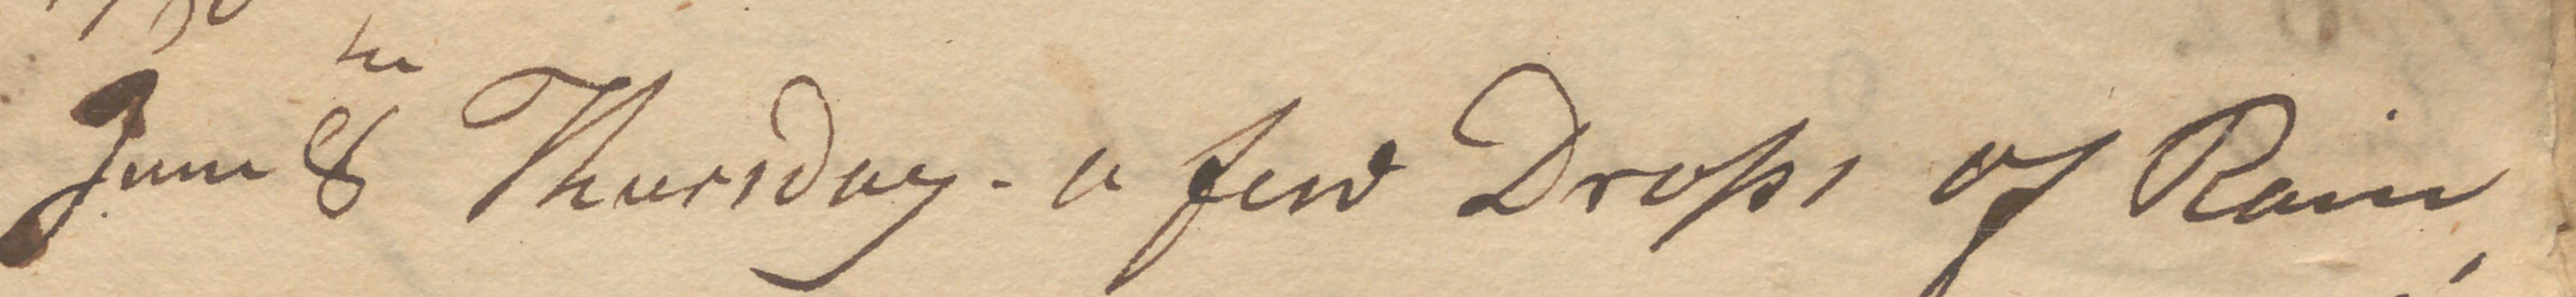June 8^th Thursday. a few Drops of Rain
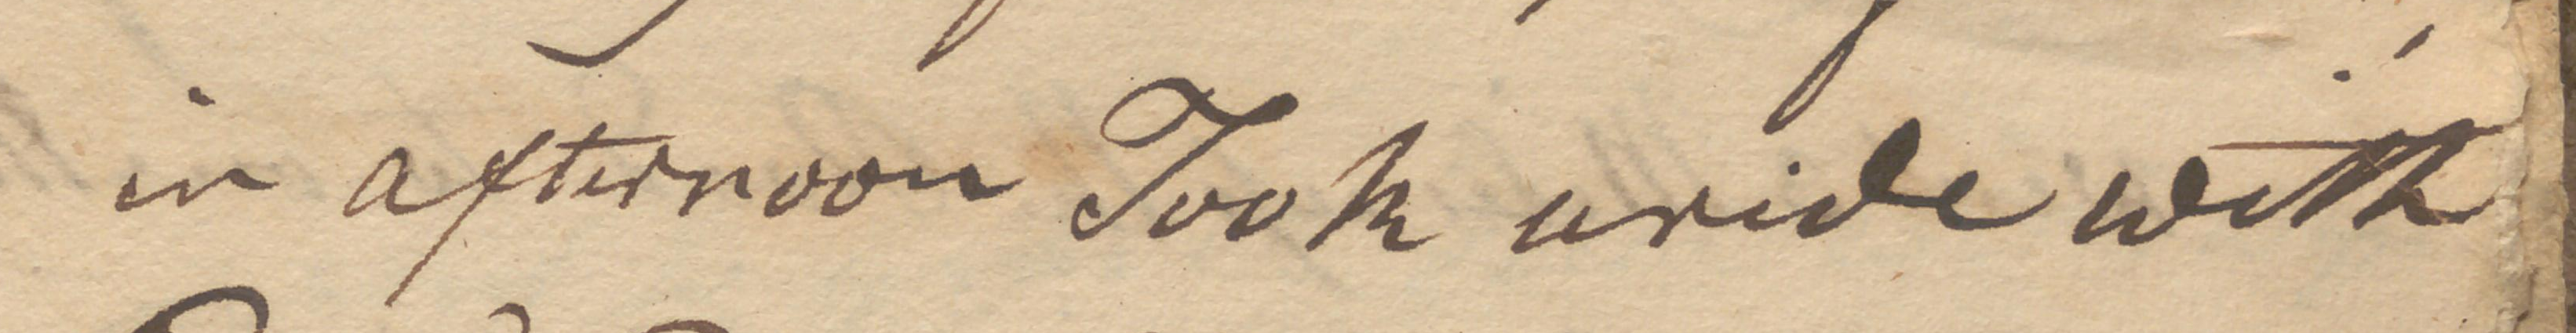in afternoon Took a ride with
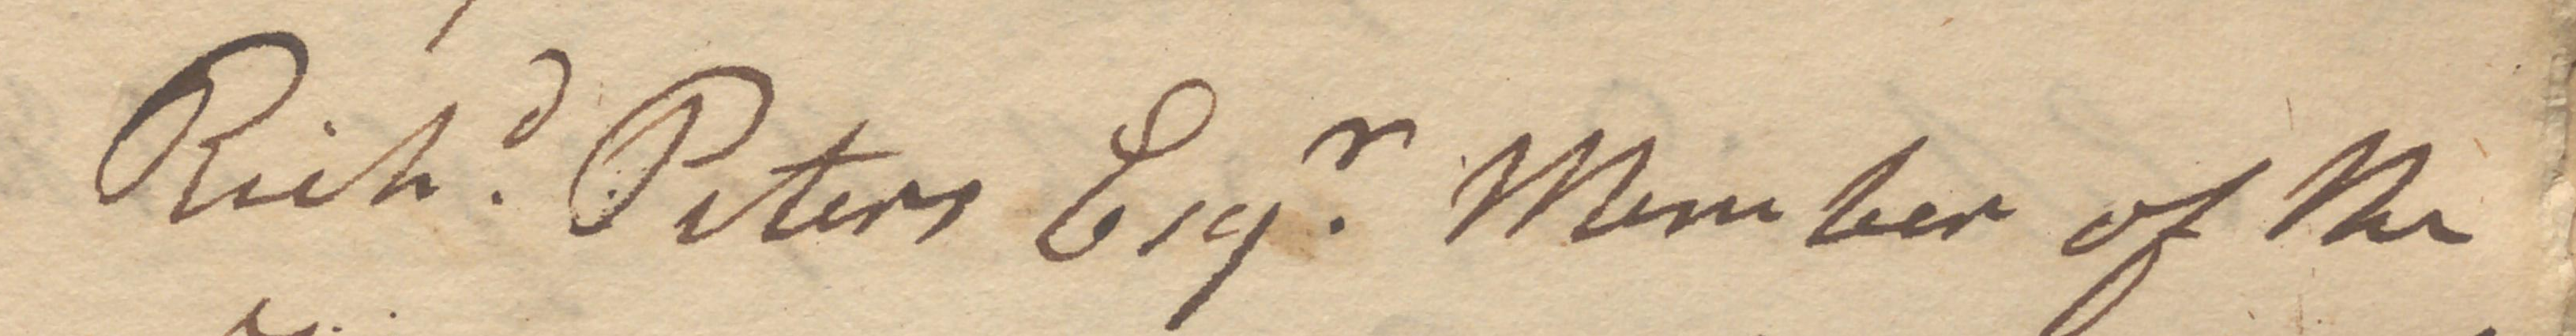Rich^d. Peters Esq^r. Member of the
